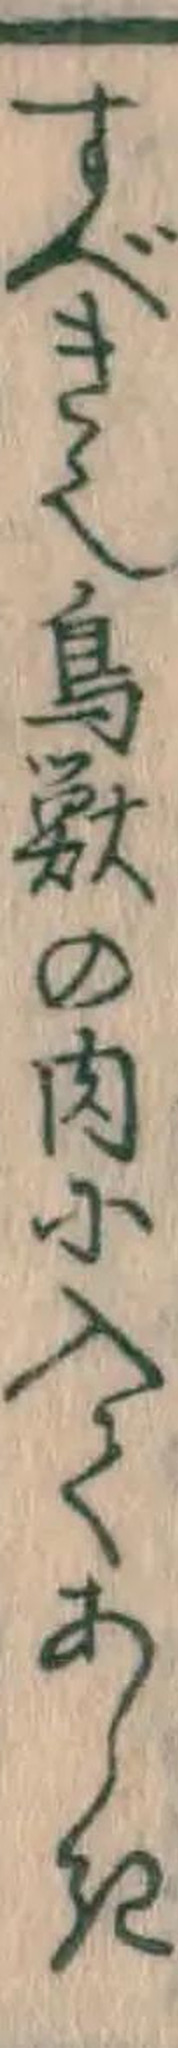すべき也鳥獣の肉に入てあしき
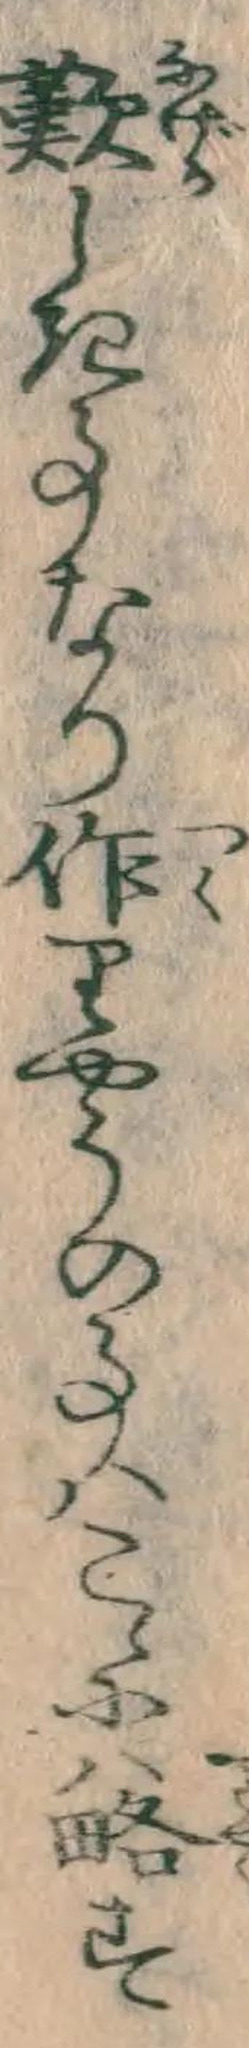歎しき事なり作りやうの事はこゝに略す
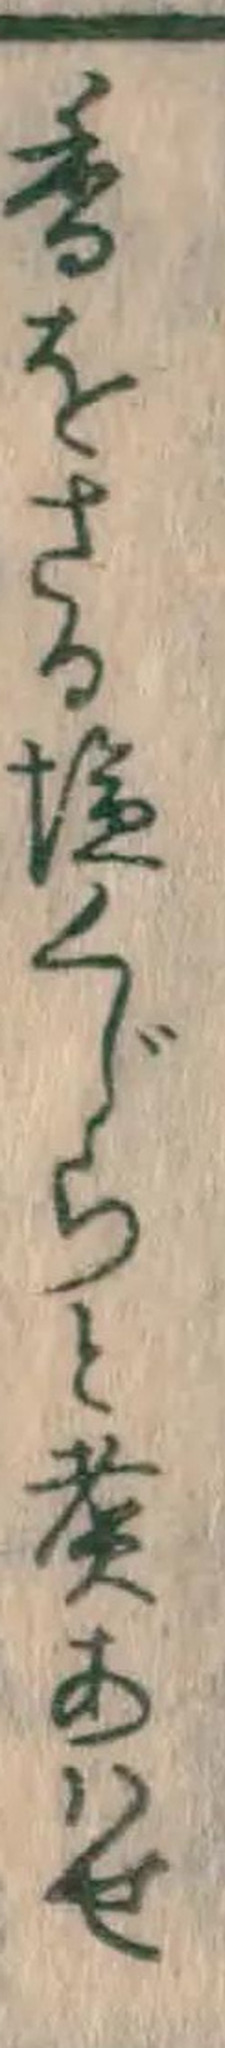香をさる塩くじらと煮あはせ
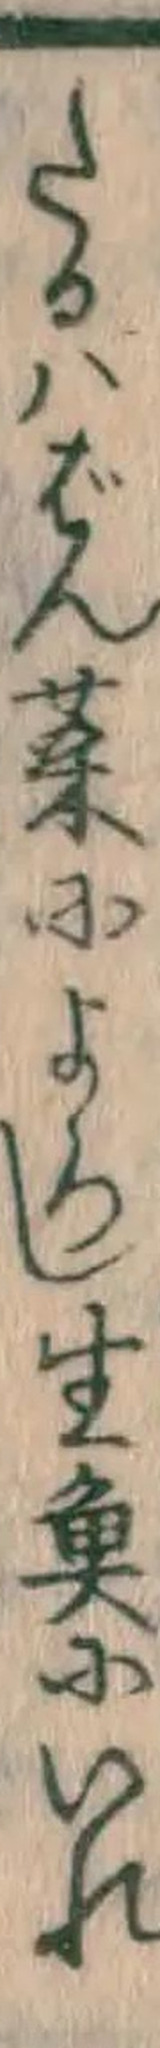たるはばん菜によろし生魚にいれ
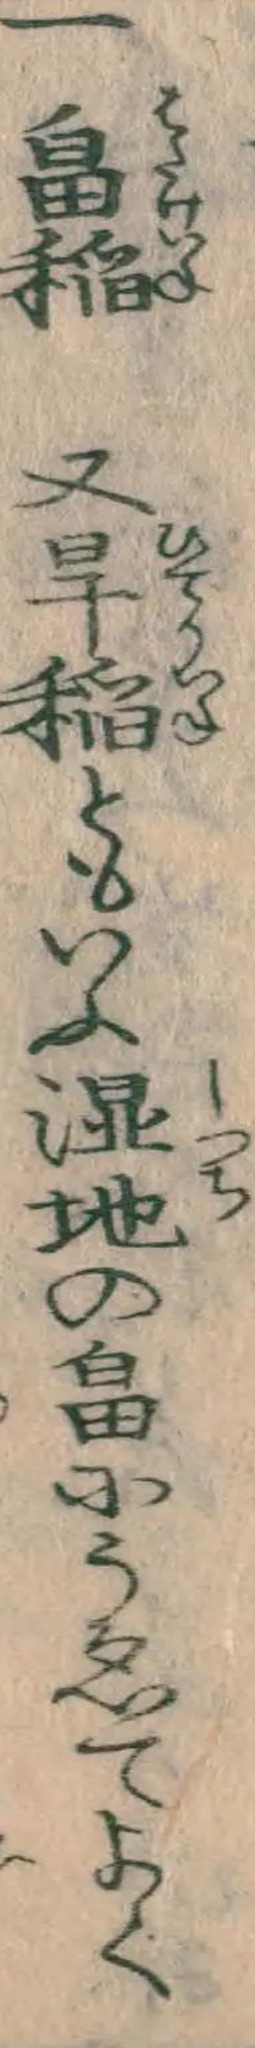一畠稲又旱稲ともいふ湿地の畠にうゑてよく
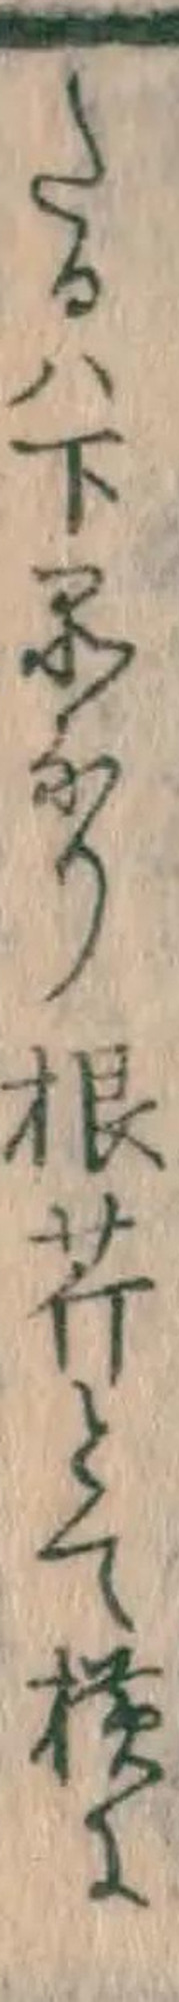たるは下品なり根芹とて横に
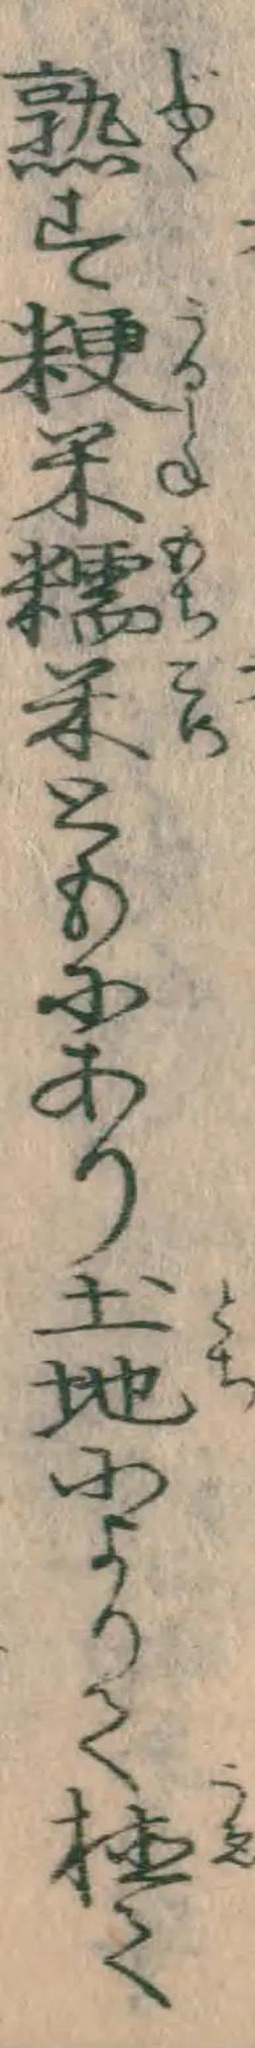熟す粳米糯米ともにあり土地によりて植て
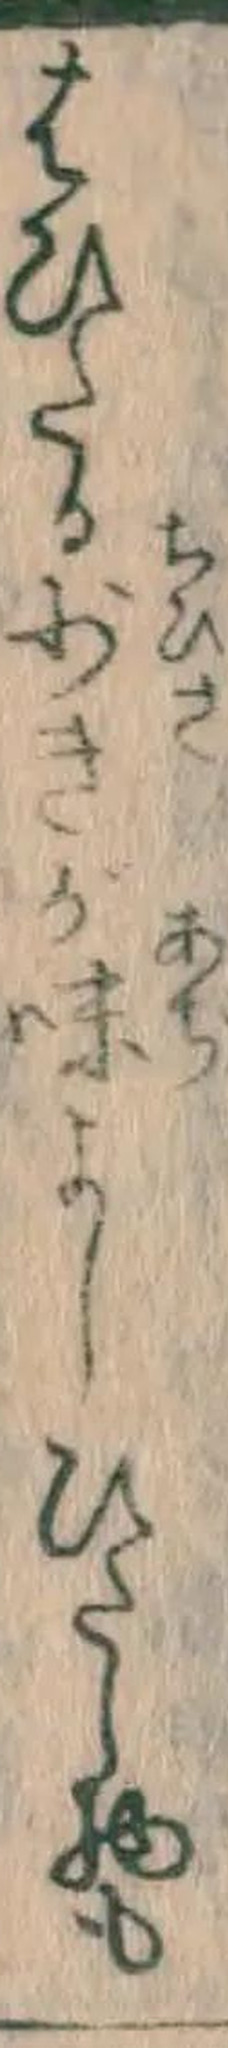はひたる小きが味よしひたし物も
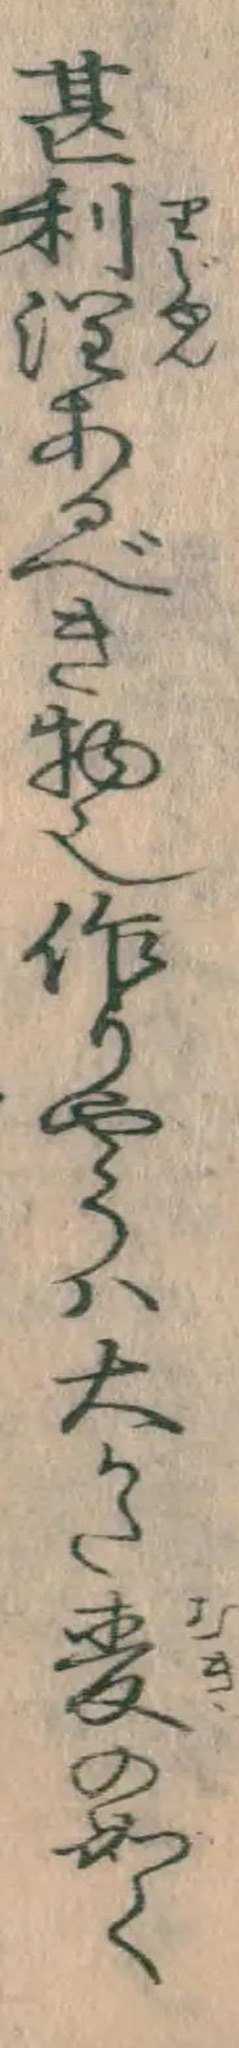甚利潤あるべき物也作りやうは大かた麦の如く
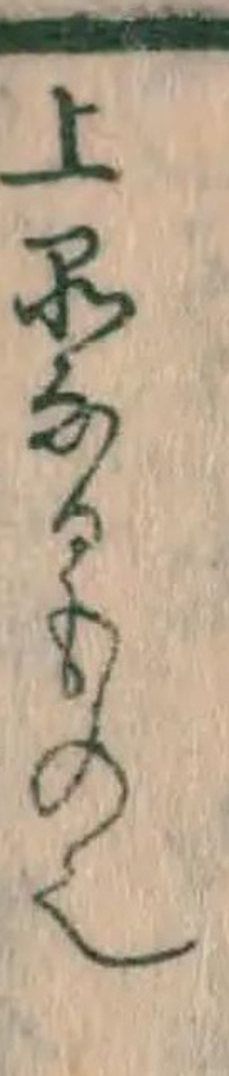上品なるもの也
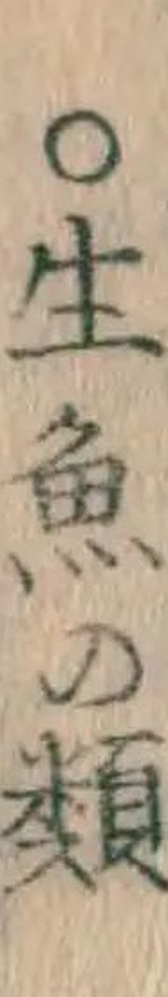◦生魚の類
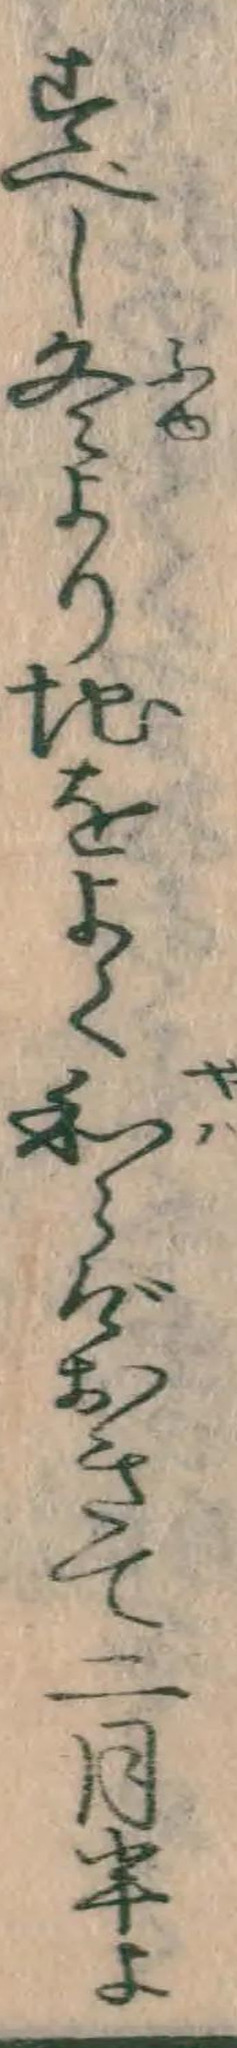すべし冬より地をよく和らげおきて二月半よ
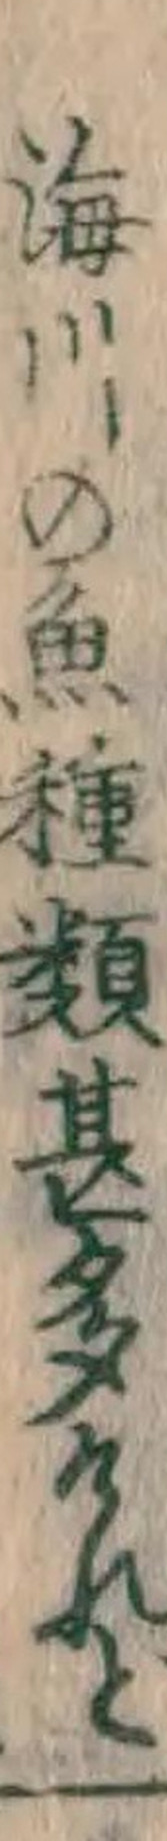海川の魚種類甚多けれど
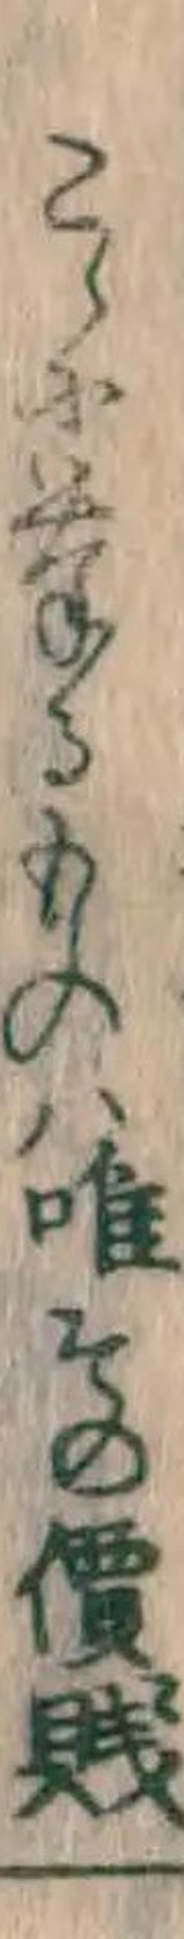こゝに挙るものは唯その價賎
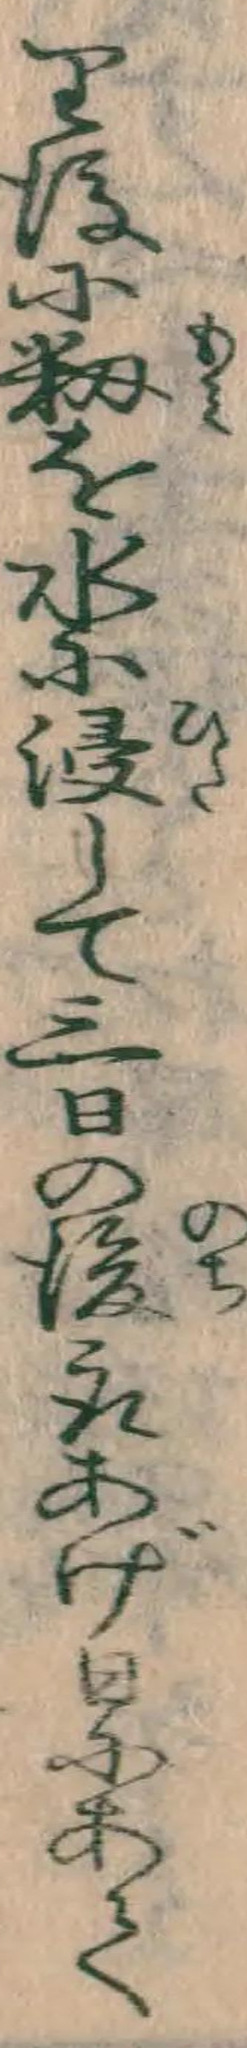り後に籾を水に浸して三日の後取あげ日にあて
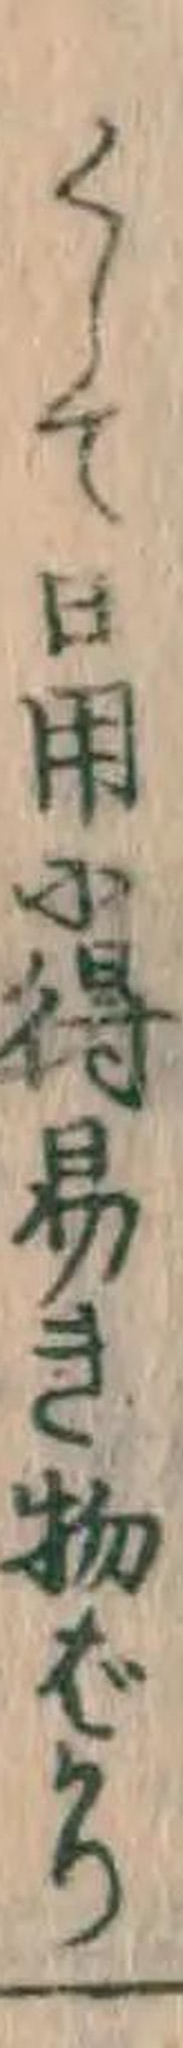くして日用に得易き物ばかり
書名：広益秘事大全 3巻. [5]
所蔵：国立国会図書館 National Diet Library, JAPAN
